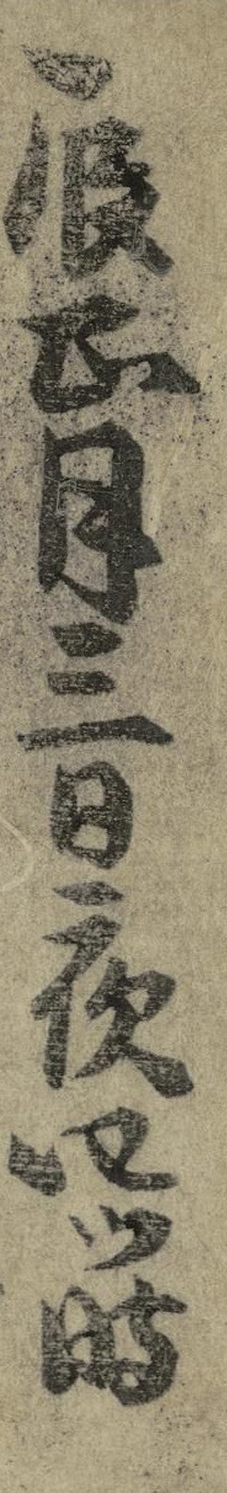辰正月三日夜四ツ時
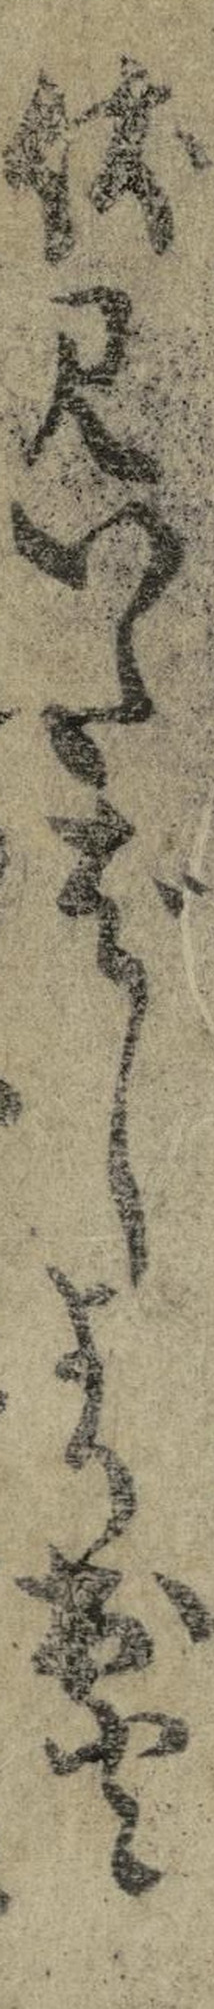伏見いたばしより出火
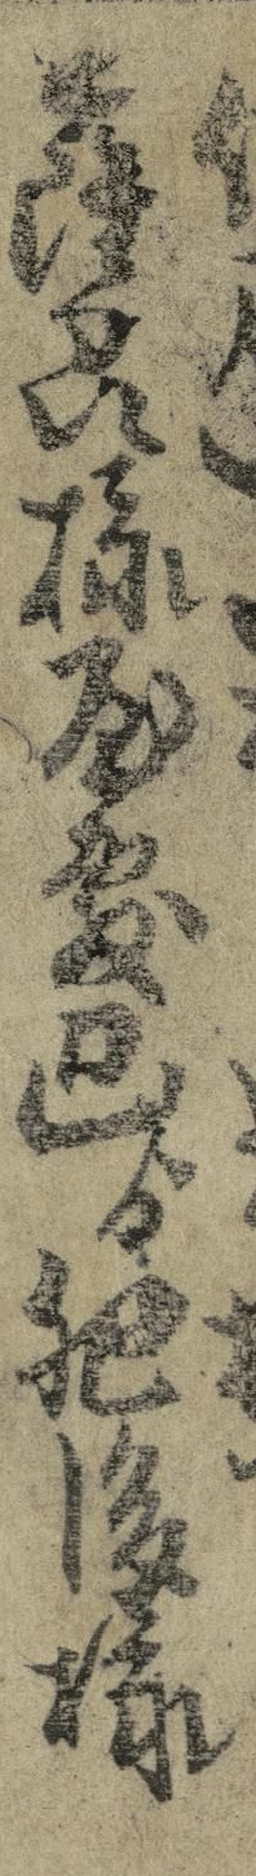薩州様屋敷辺ゟ肥後様
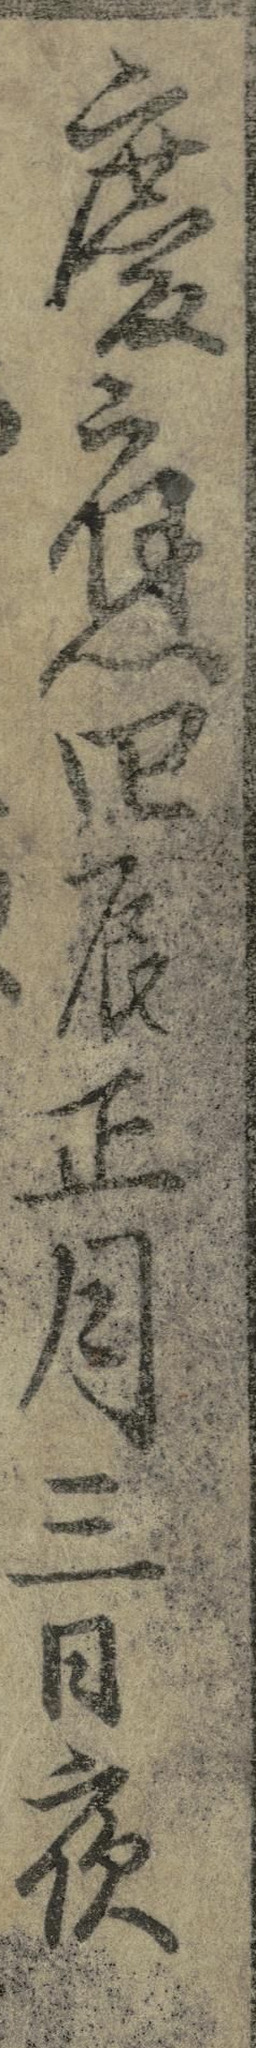慶應四辰正月三日夜
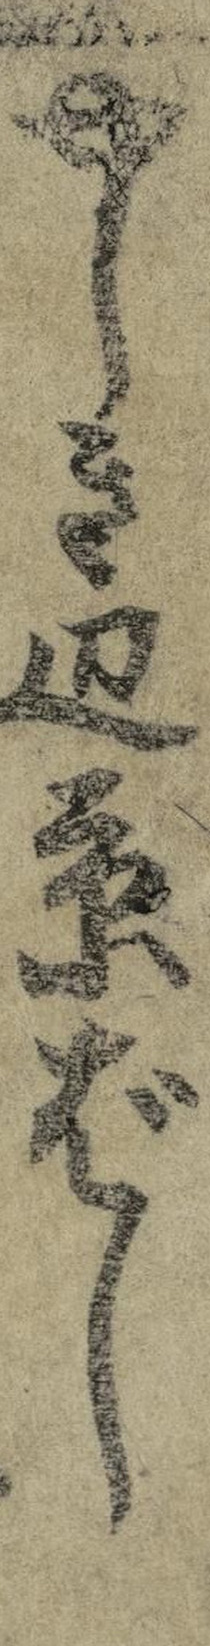やしき辺京ばし
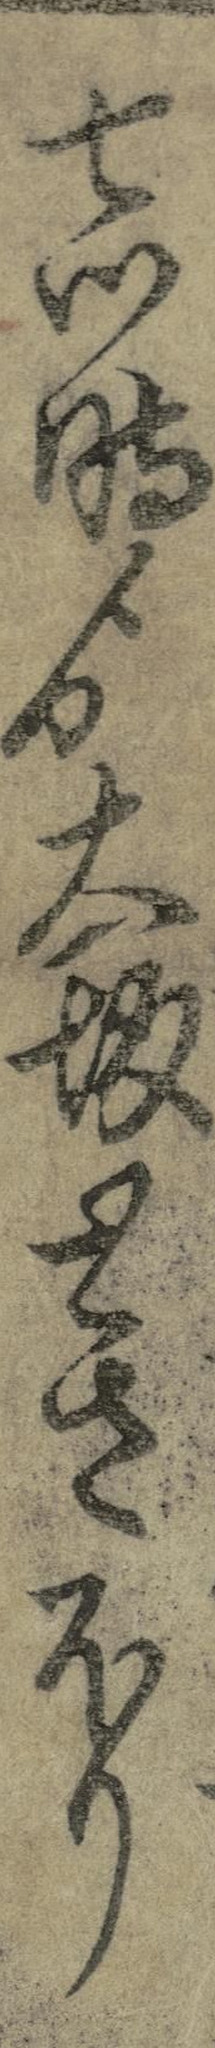七ツ時ゟ大坂とさほり
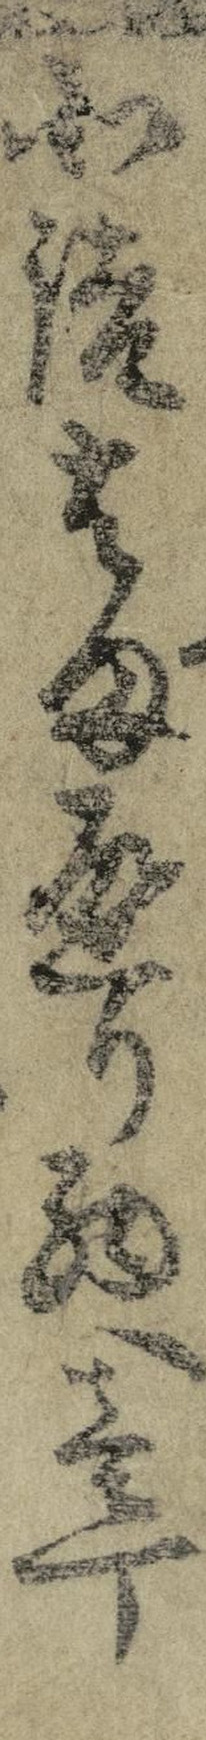北詰はま通り西へ壱丁
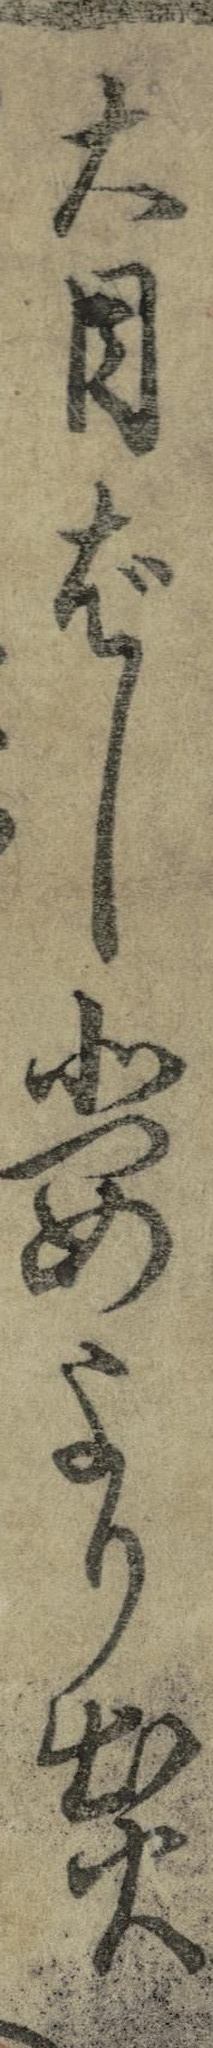大月ばし北つめより出火
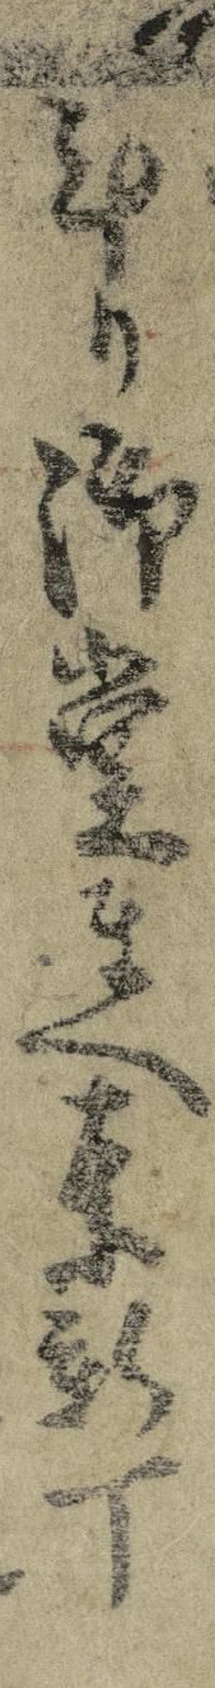斗り御堂まへ東新丁
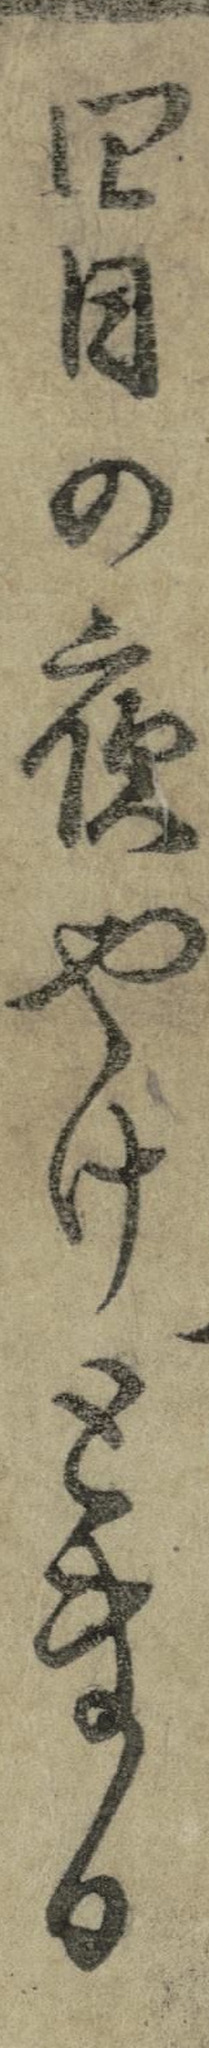四日の夜やけとまる
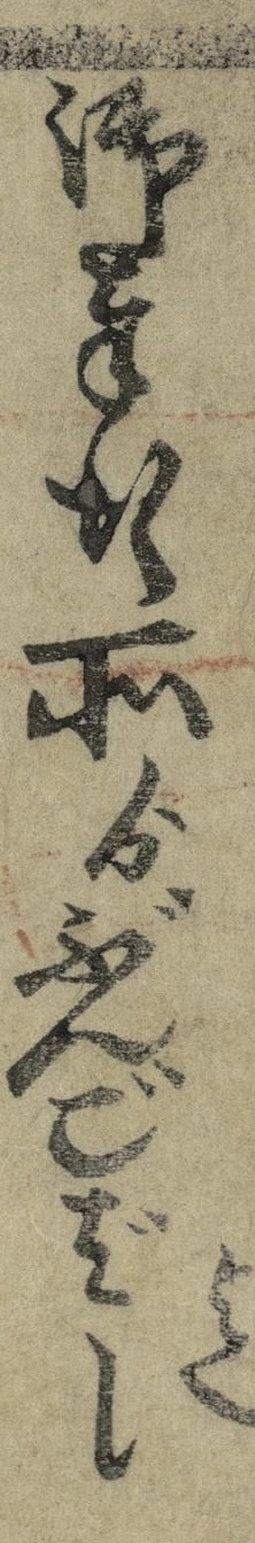御奉行所ゟぶんごばし
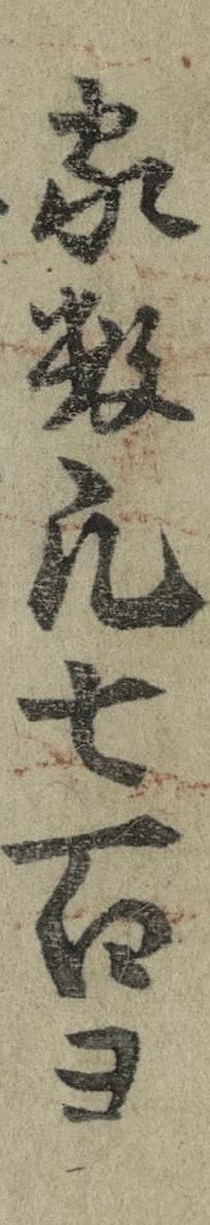家数凡七百ヨ
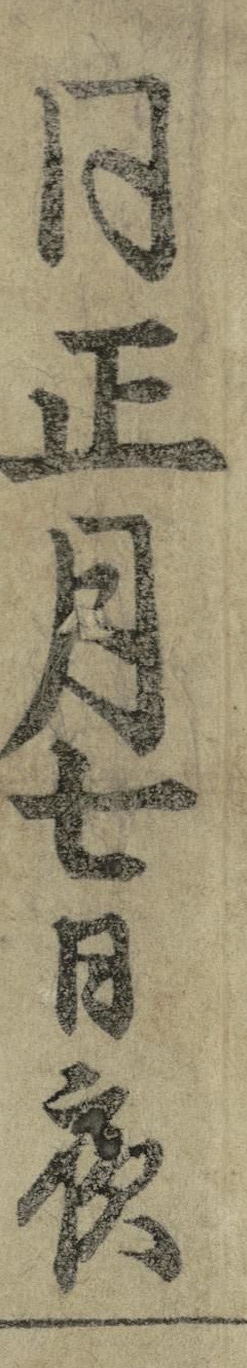同正月七日夜
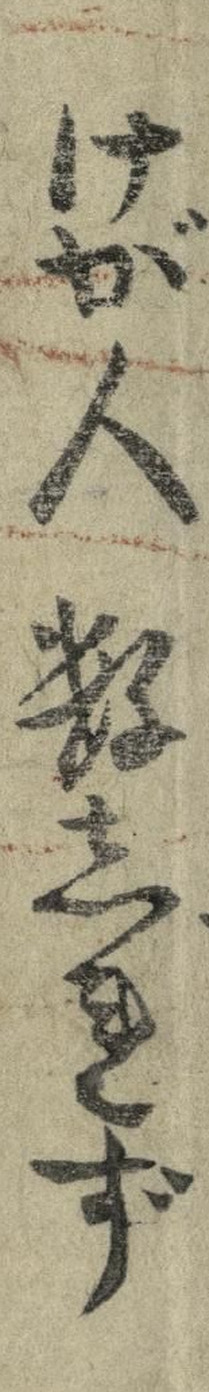けが人数しれず
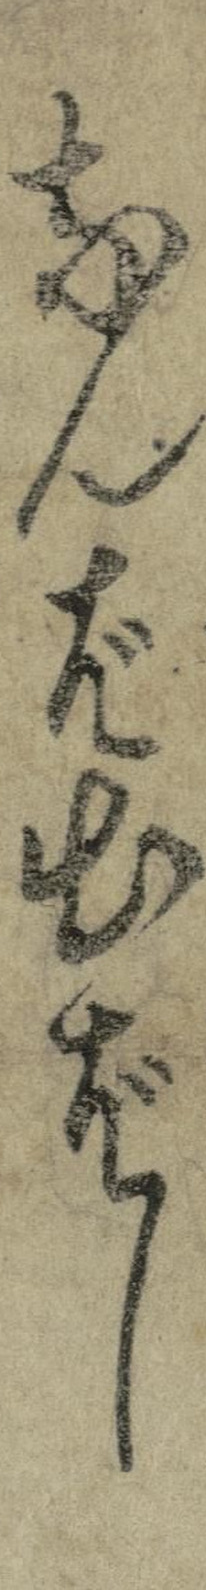なんば出ばし
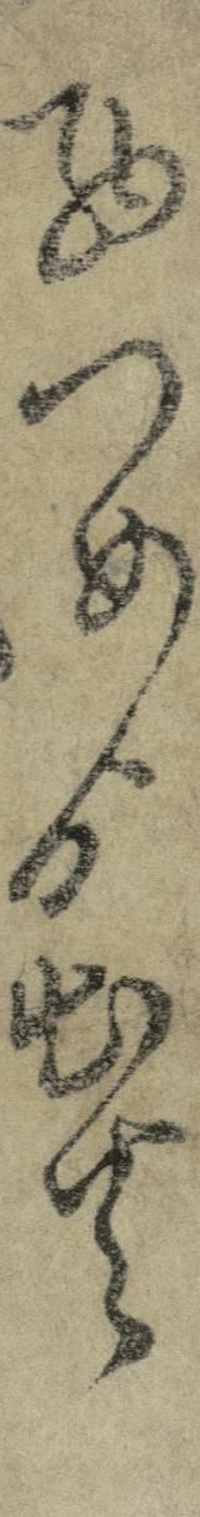西つめゟ出火
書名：淀川大坂堺大火細見本しらべ
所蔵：東京大学地震研究所図書室 Earthquake Research Institute Library, The University of Tokyo, JAPAN
